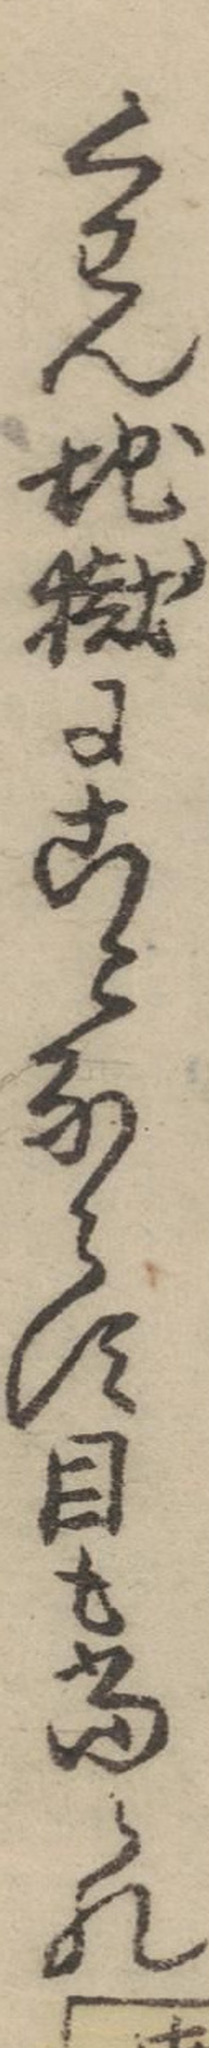くわん地獄にことならず目も当られ
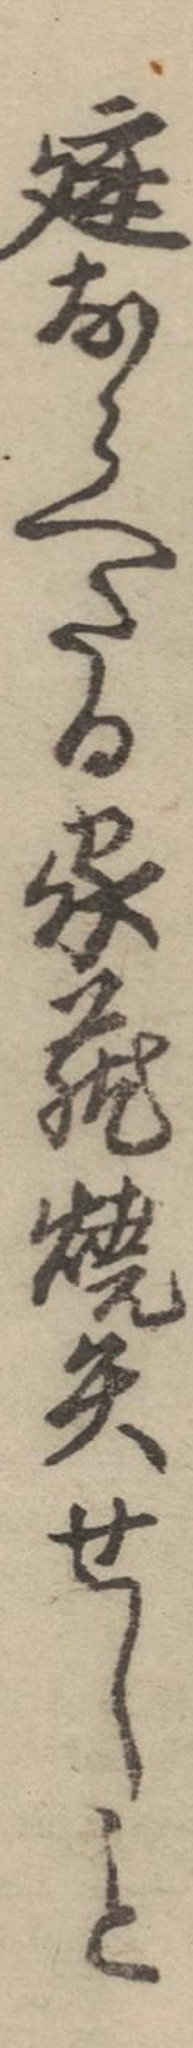庭ならへたる家蔵焼失せしこと
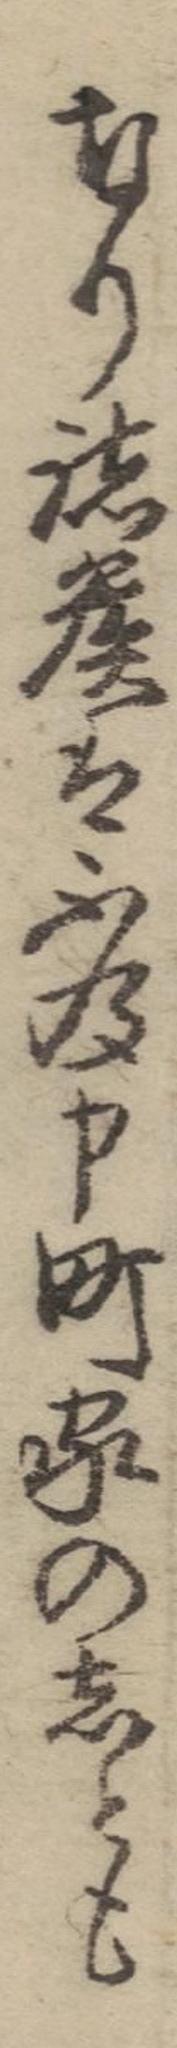なり諸矦は不及申町家の者とも
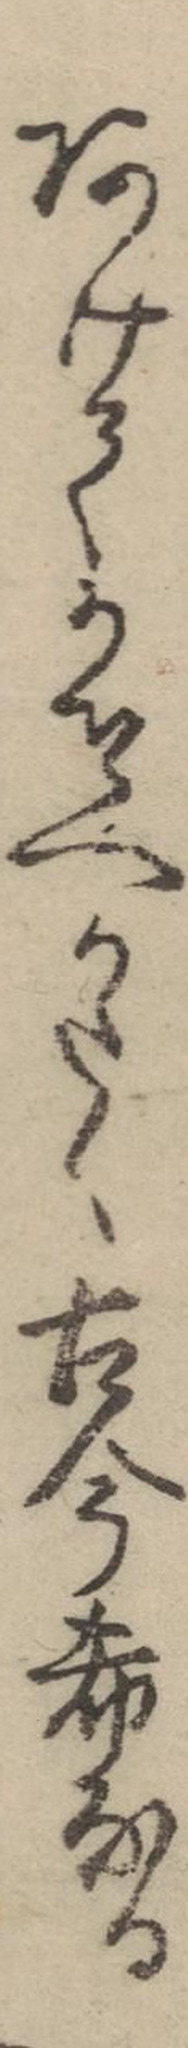あけてかそへかたく古今希なる
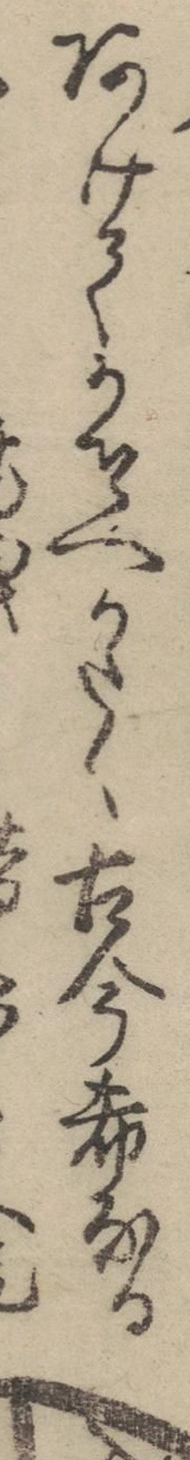あけてかそへかたく古今希なる
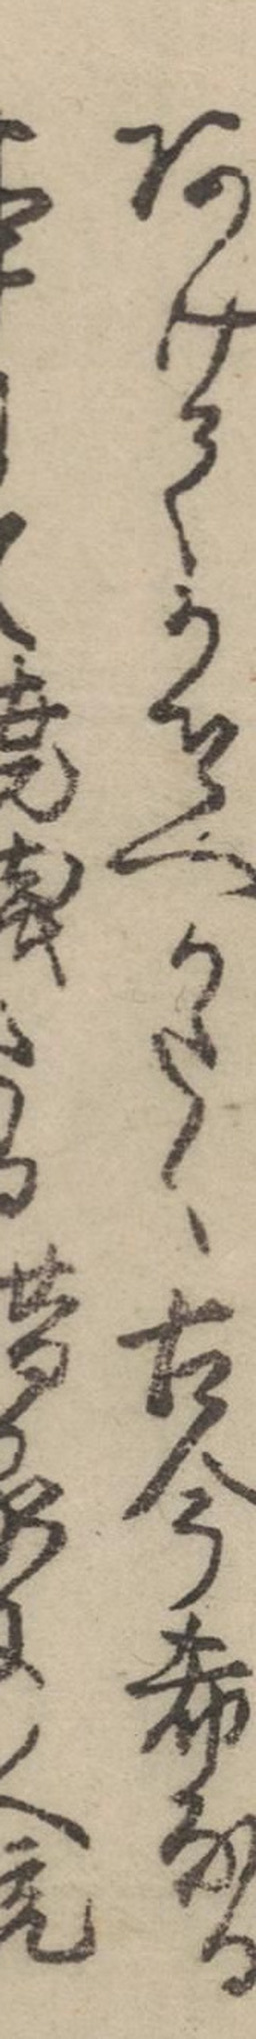事にて焼残たる借家に人充
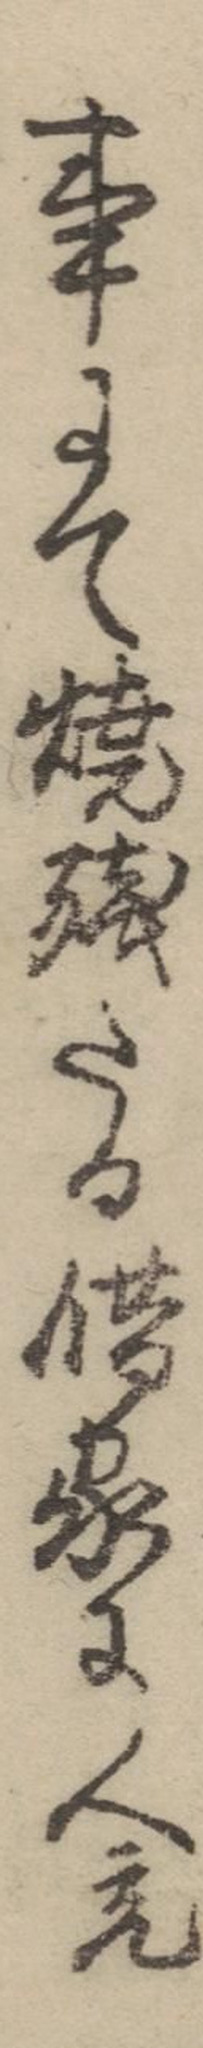事にて焼残たる借家に人充
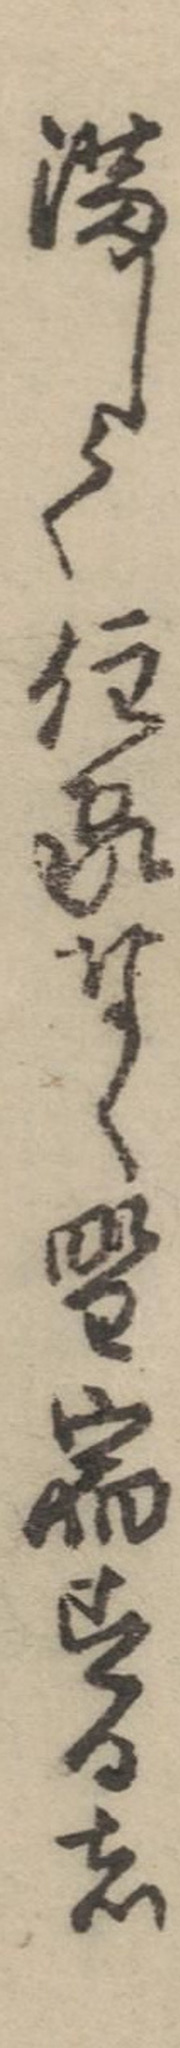満して住家なく野宿する者
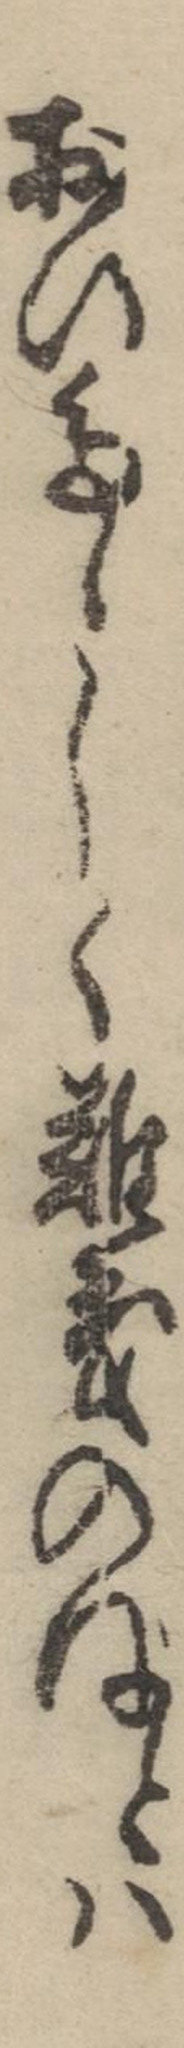おひたゞしく難義のほとは
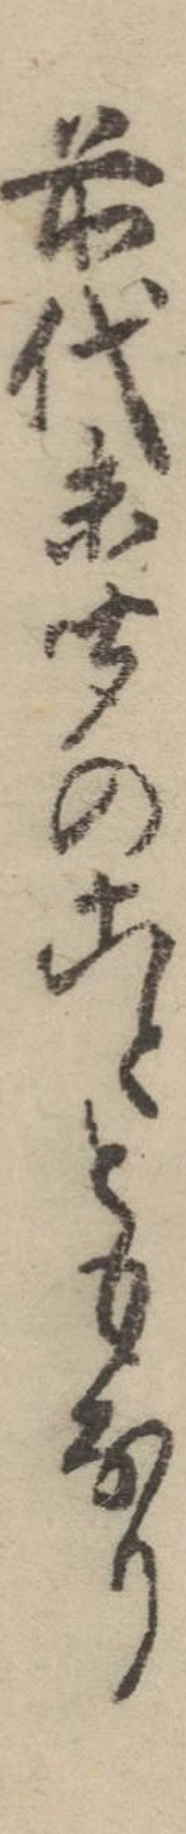前代未聞のことともなり
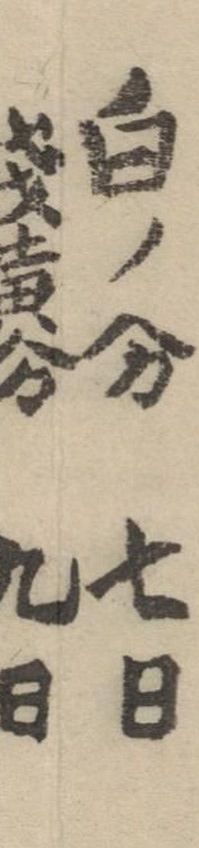白ノ分七日
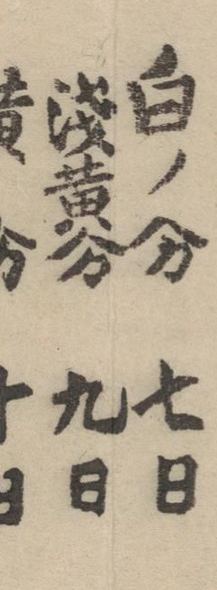白ノ分七日
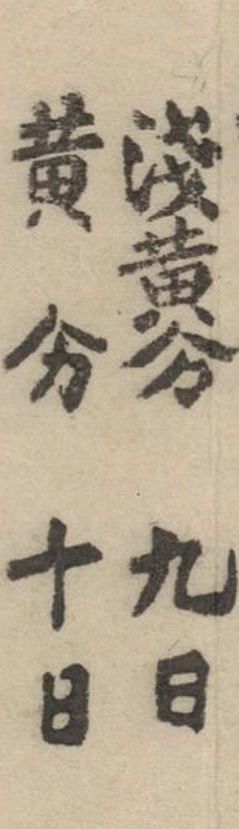黄分十日
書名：[天保五年二月の江戸大火に関する瓦版]
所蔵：東京大学地震研究所図書室 Earthquake Research Institute Library, The University of Tokyo, JAPAN
